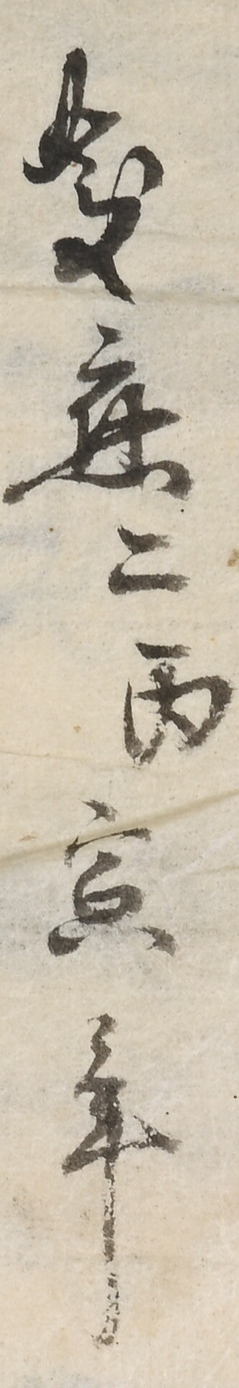慶応二丙寅年
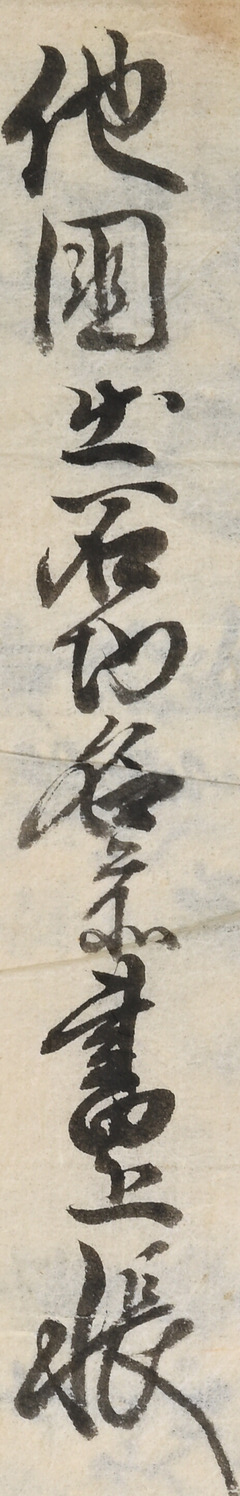他国出石切名前書上帳
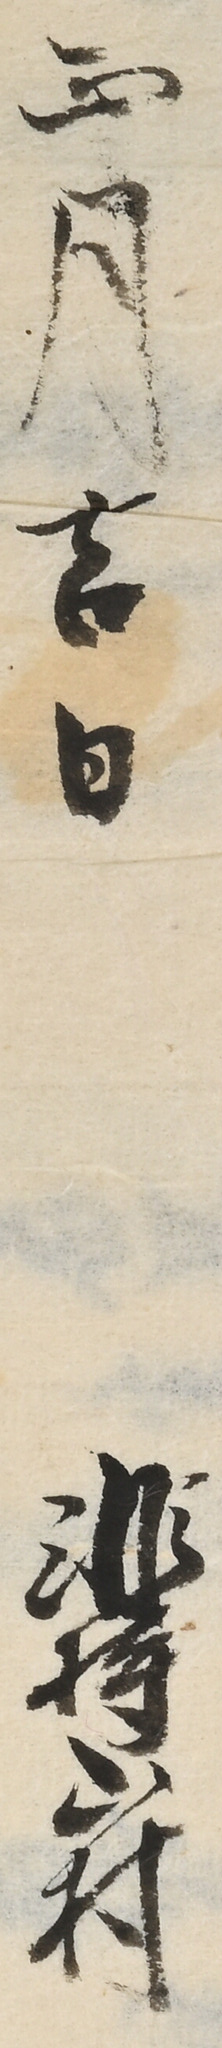正月吉日非持山村

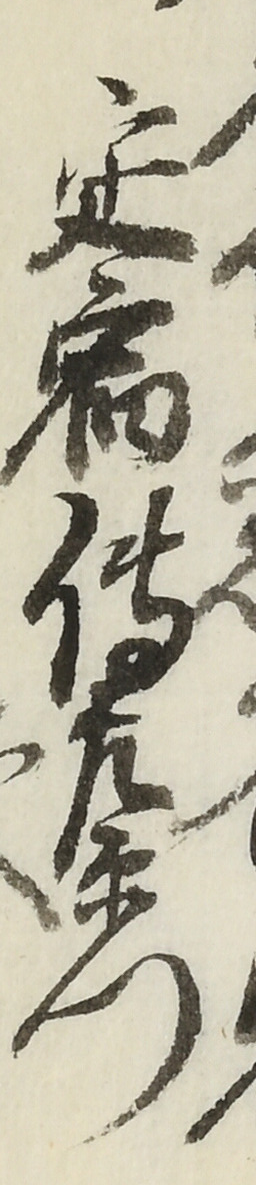定宿伝左衛門
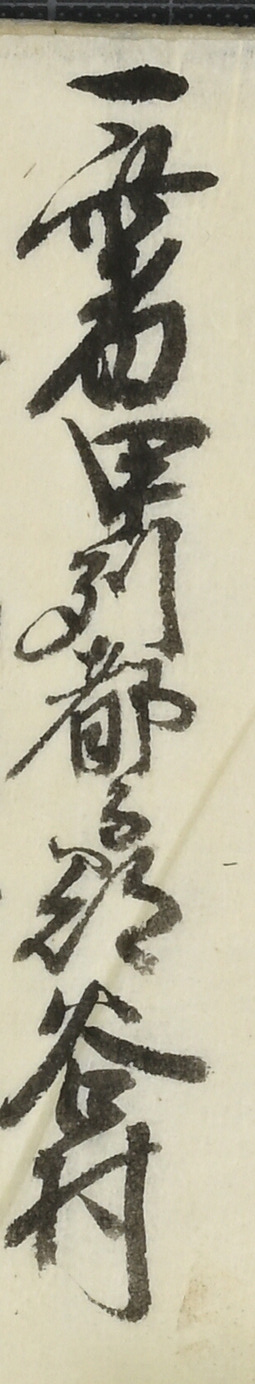一此者甲州都留郡谷村
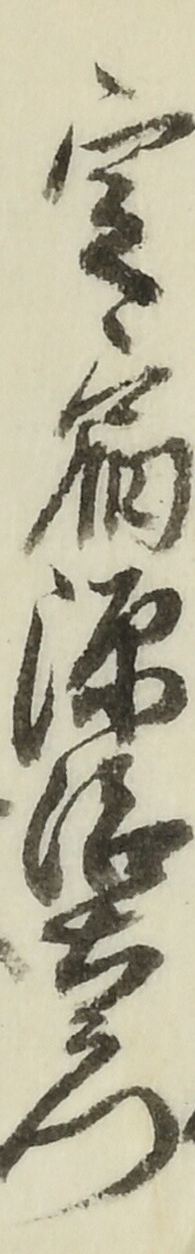定宿源治右衛門

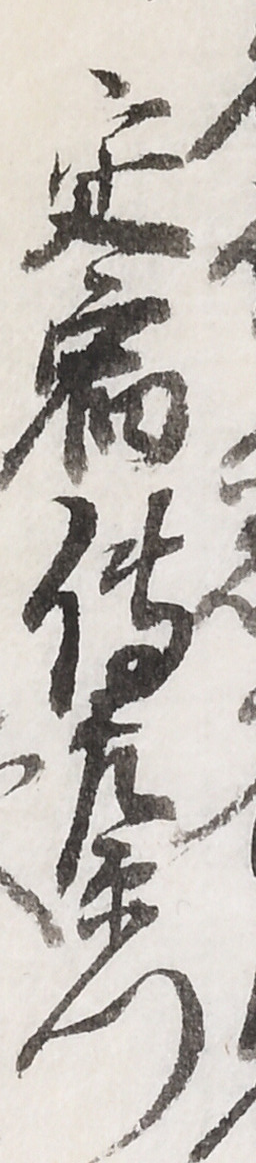定宿伝左衛門
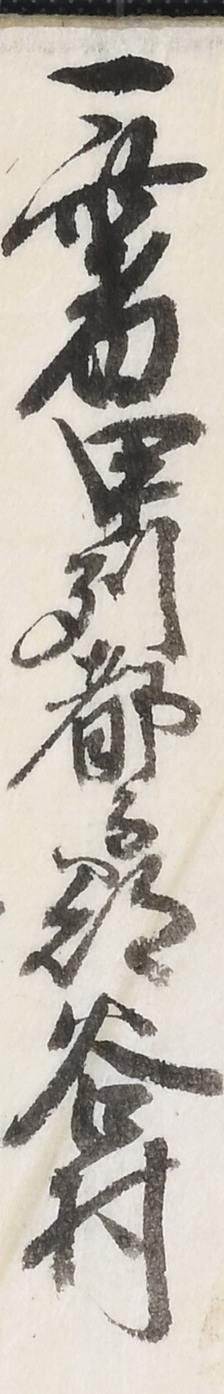一此者甲州都留郡谷村
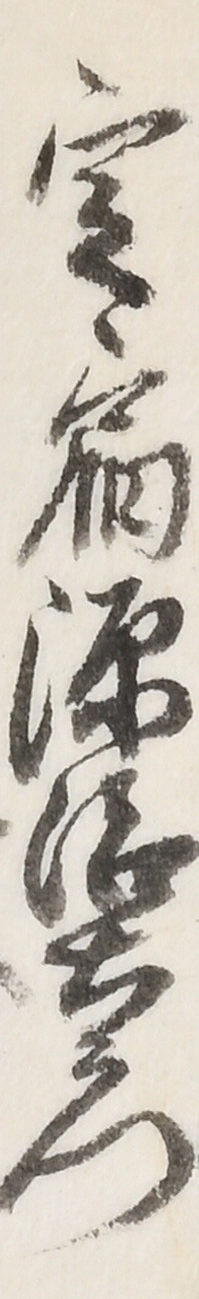定宿源治右衛門
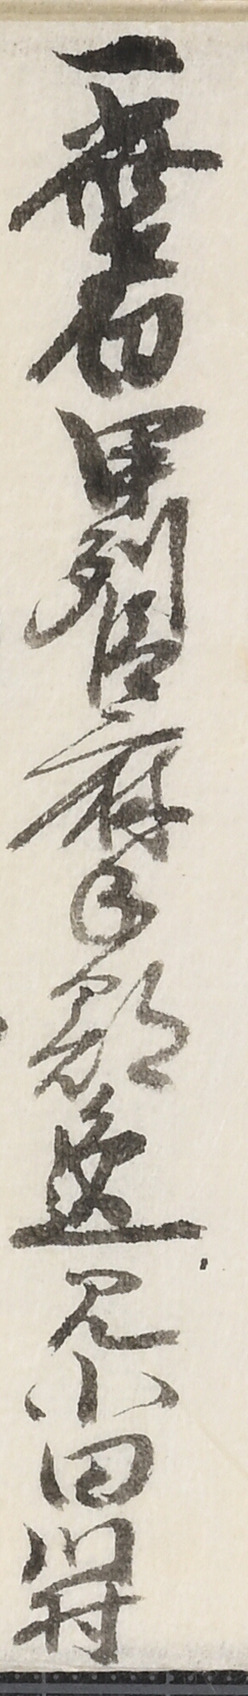一此者甲州巨摩郡逸見小田川村
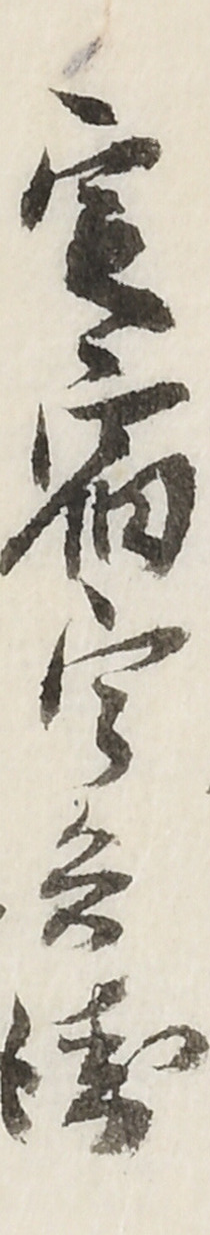定宿宇兵衛
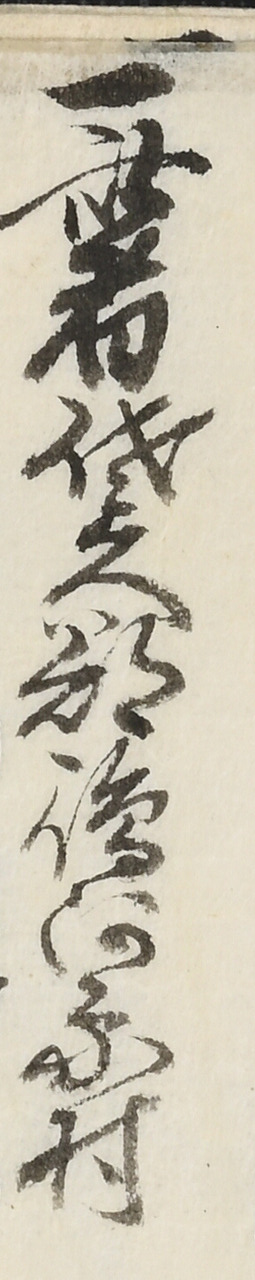一此者佐久郡島河原村
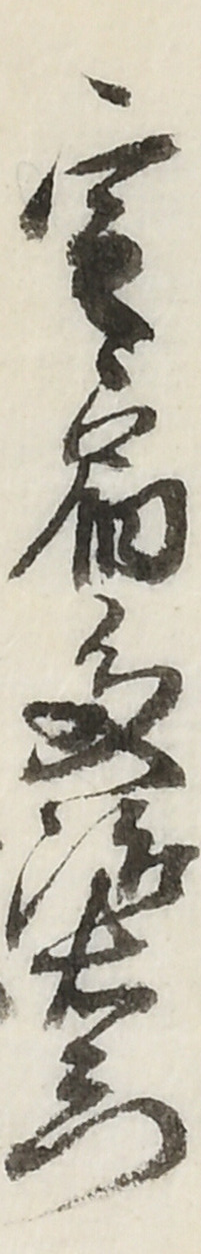定宿多治右衛門

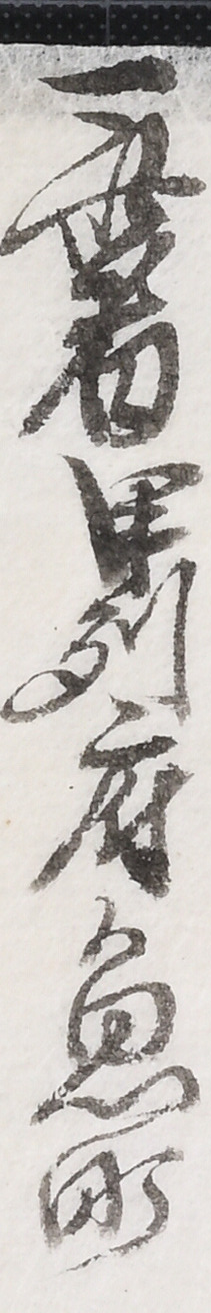一此者甲州府魚町
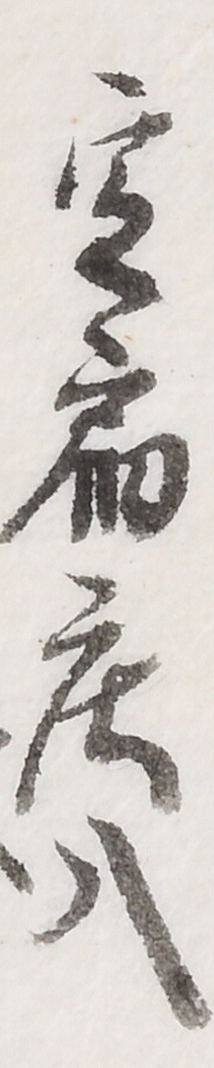定宿庄八
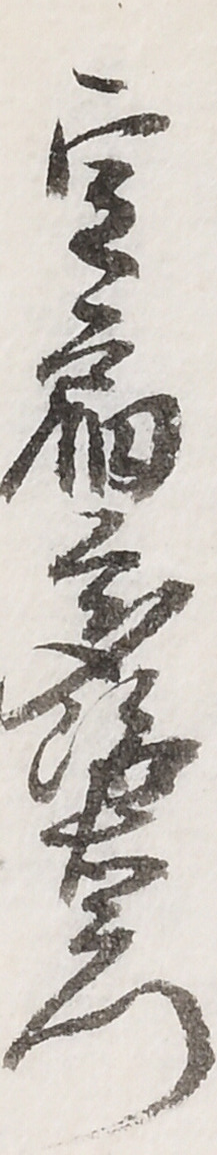定宿多治右衛門
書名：慶應二丙寅年正月吉日他國出石切名前書上帳
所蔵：伊那市立高遠町図書館・合同会社AMANE
